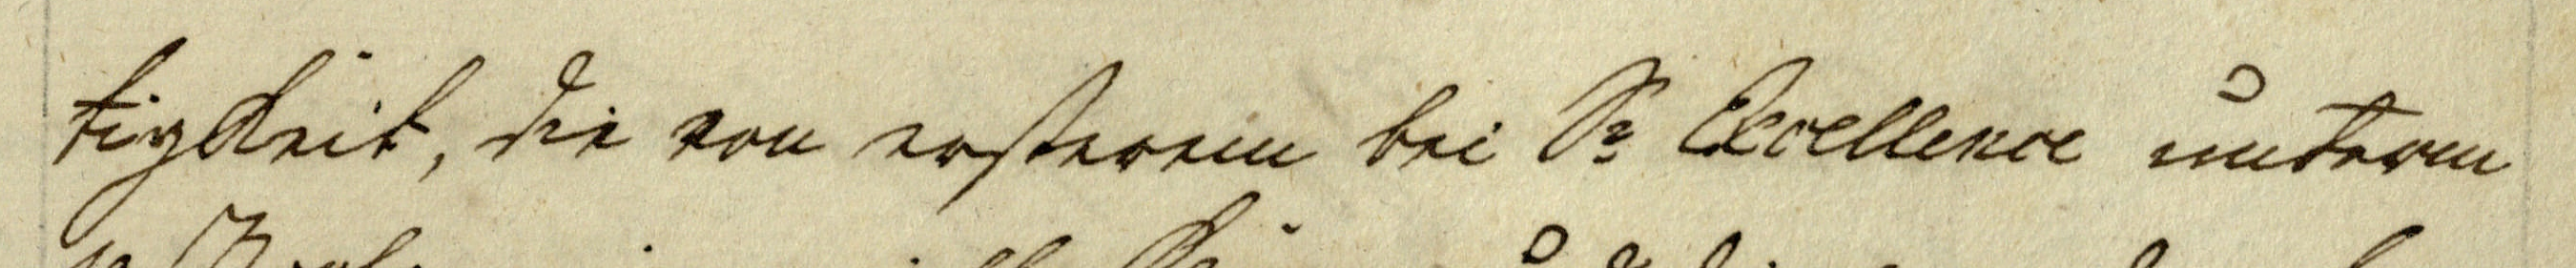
tigkeit, die von ersterem bei Sr Excellence unterm
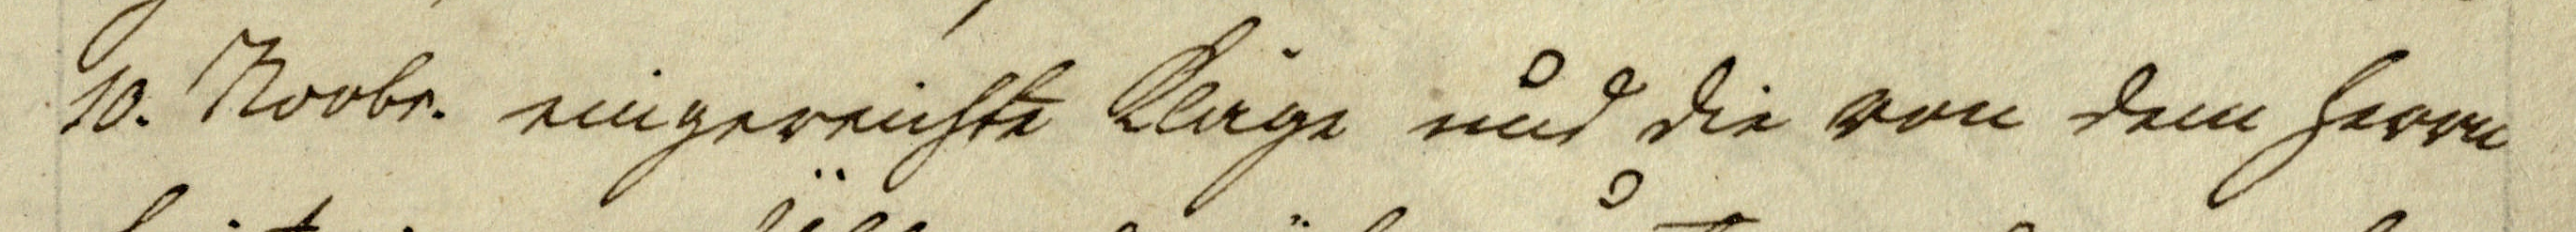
10. Novbr. eingereichte Klage und die von dem Herrn
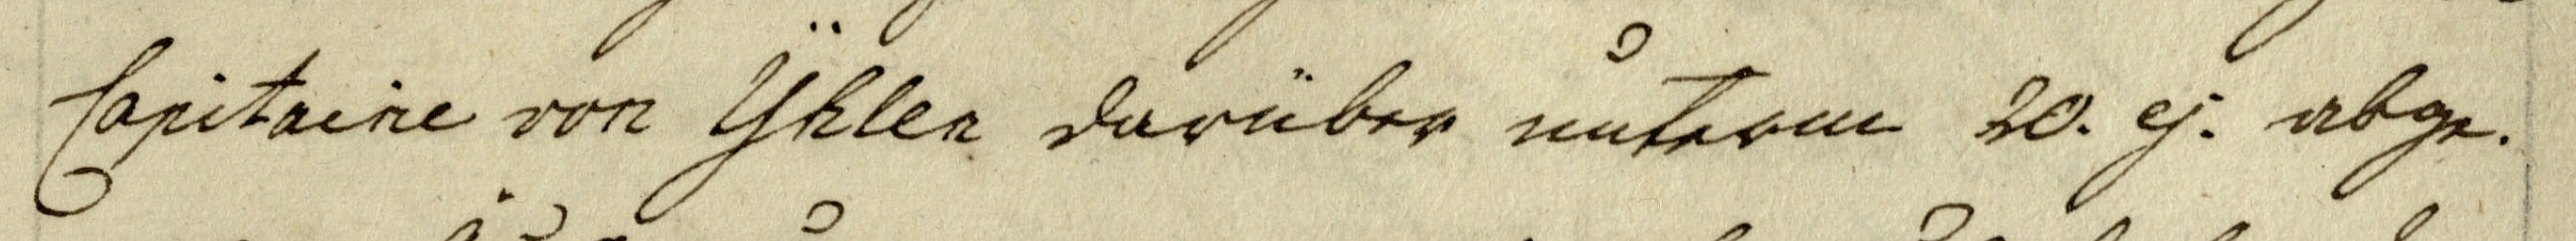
Capitaine von Ÿhlen darüber unterm 20. ej. abge¬
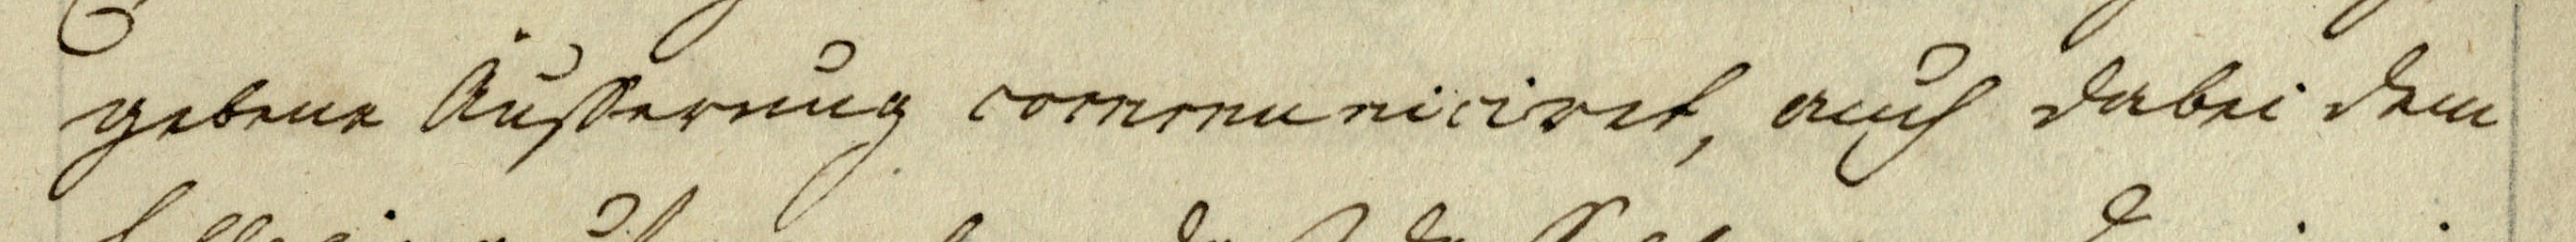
gebene Äusserung communiciret, auch dabei dem
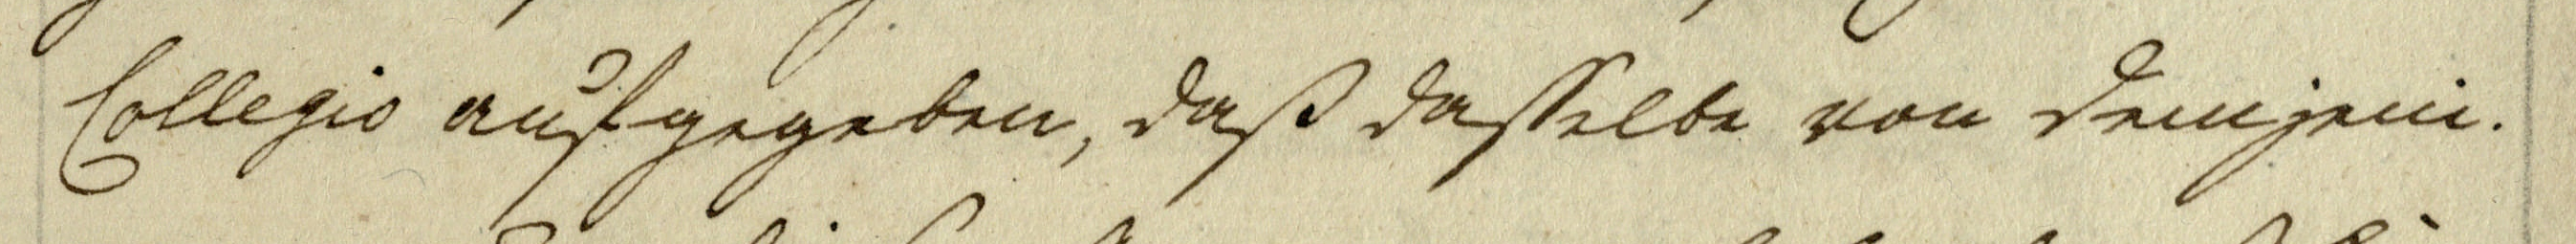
Collegio aufgegeben, daß dasselbe von demjeni¬
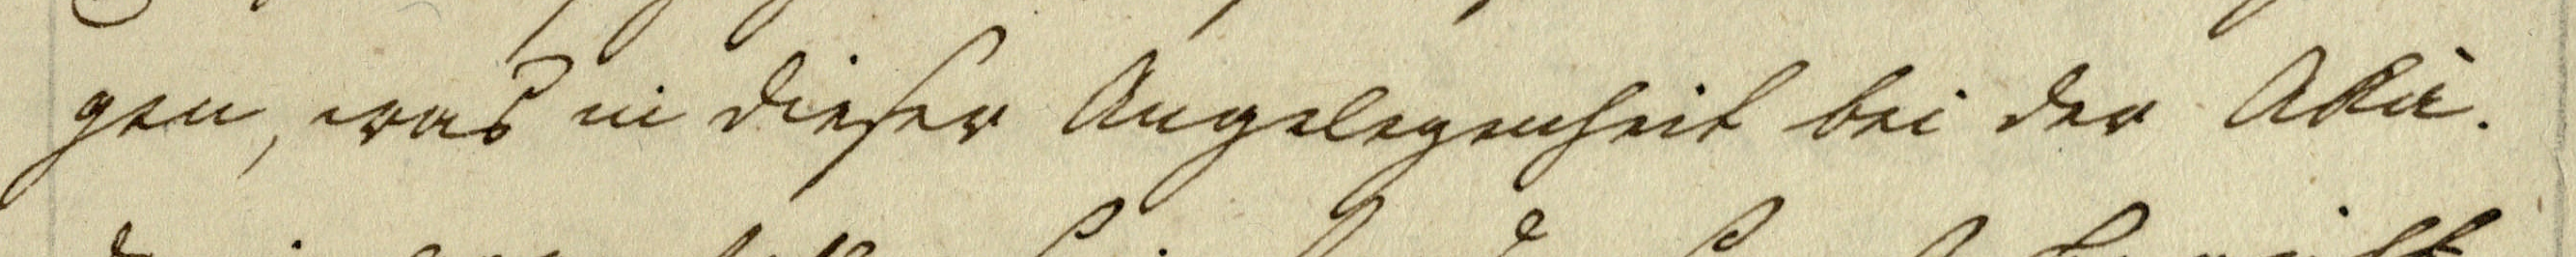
gen, was in dieser Angelegenheit bei der Aka¬
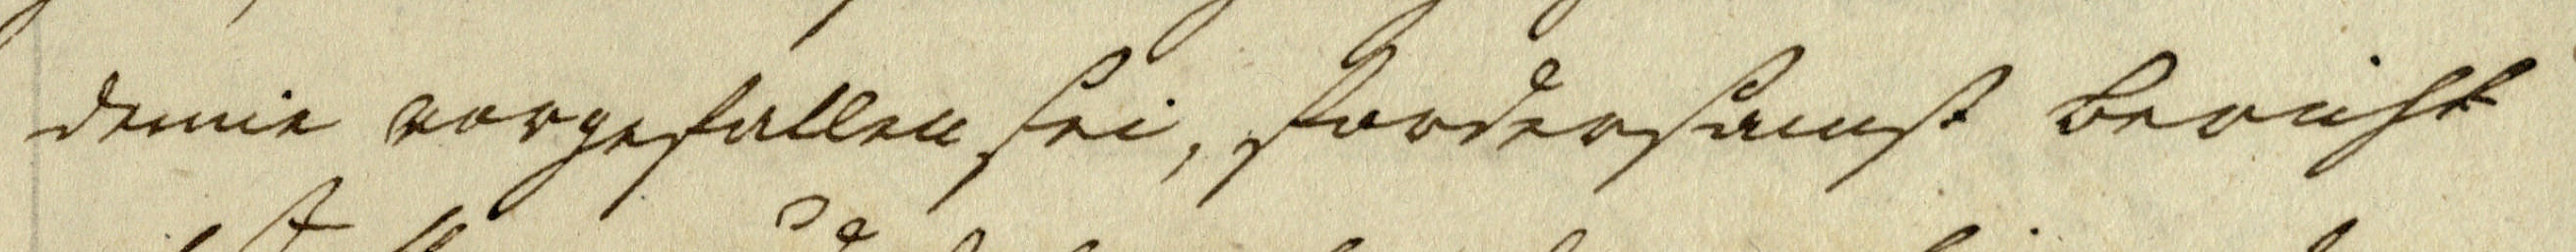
demie vorgefallen sei, fordersamst Bericht
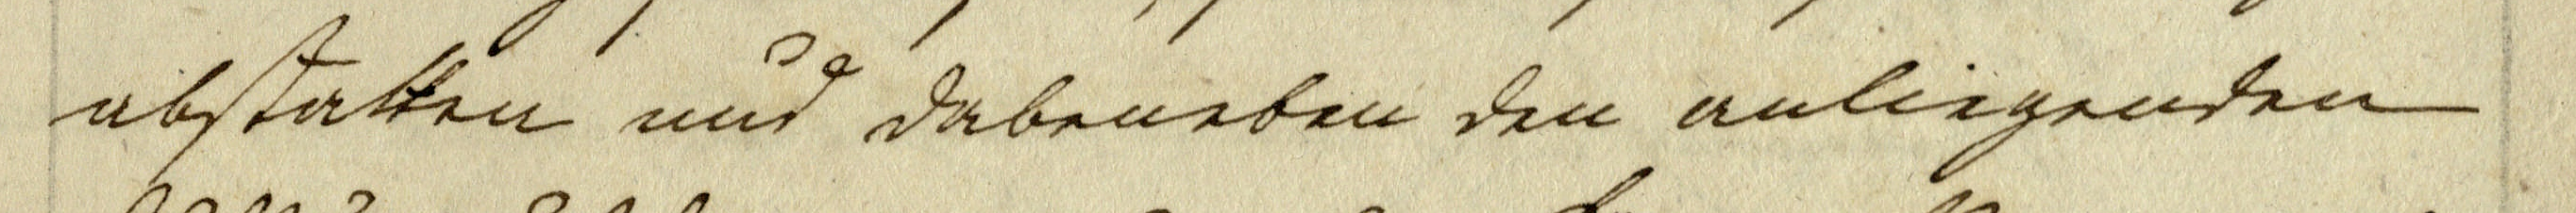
abstatten und dabeneben den anliegenden
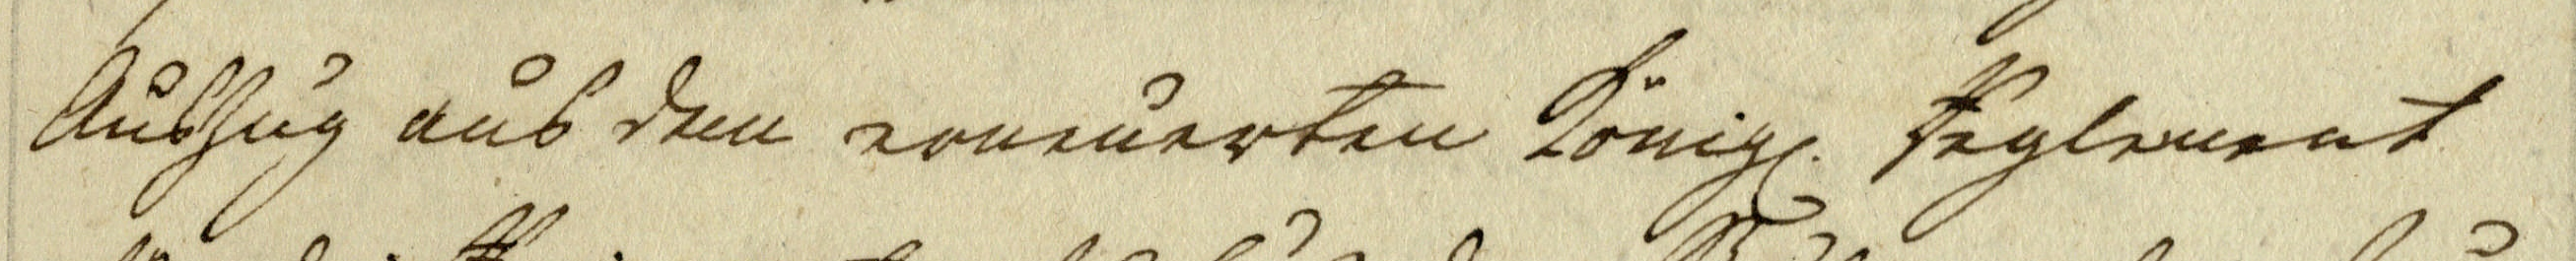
Auszug aus dem erneuerten Königl. Reglement
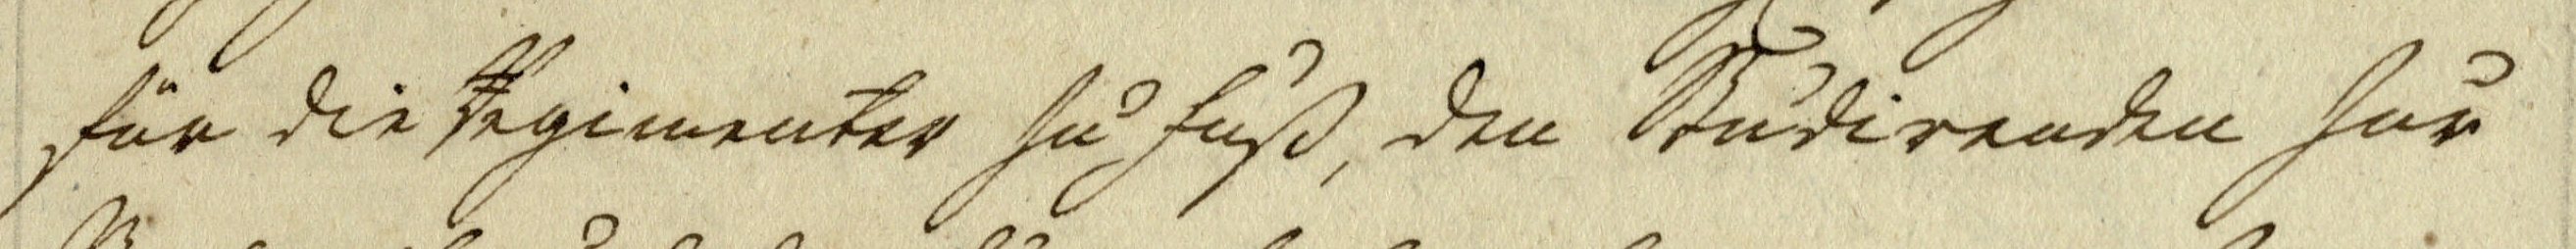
für die Regimenter zu Fuß, den Studirenden zur
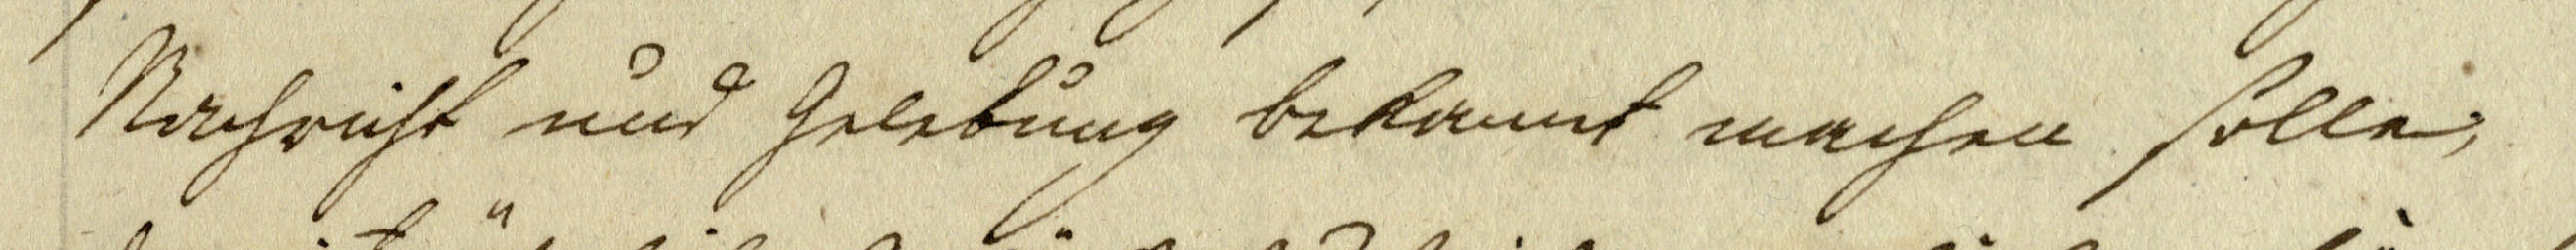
Nachricht und Gelebung bekannt machen solle,
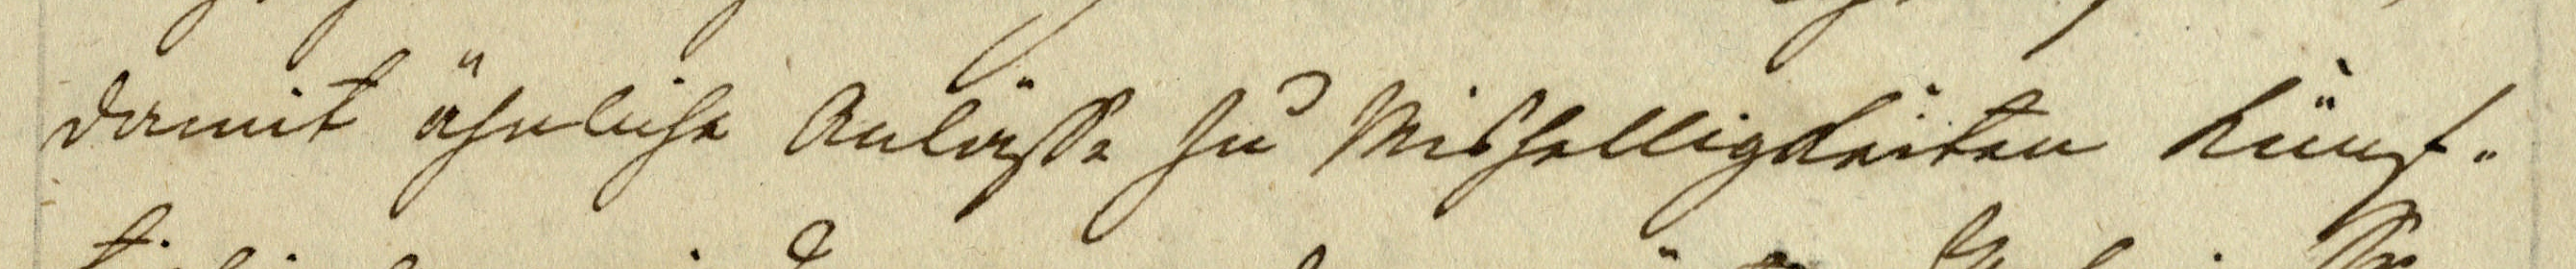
damit ähnliche Anlässe zu Mishelligkeiten künf¬
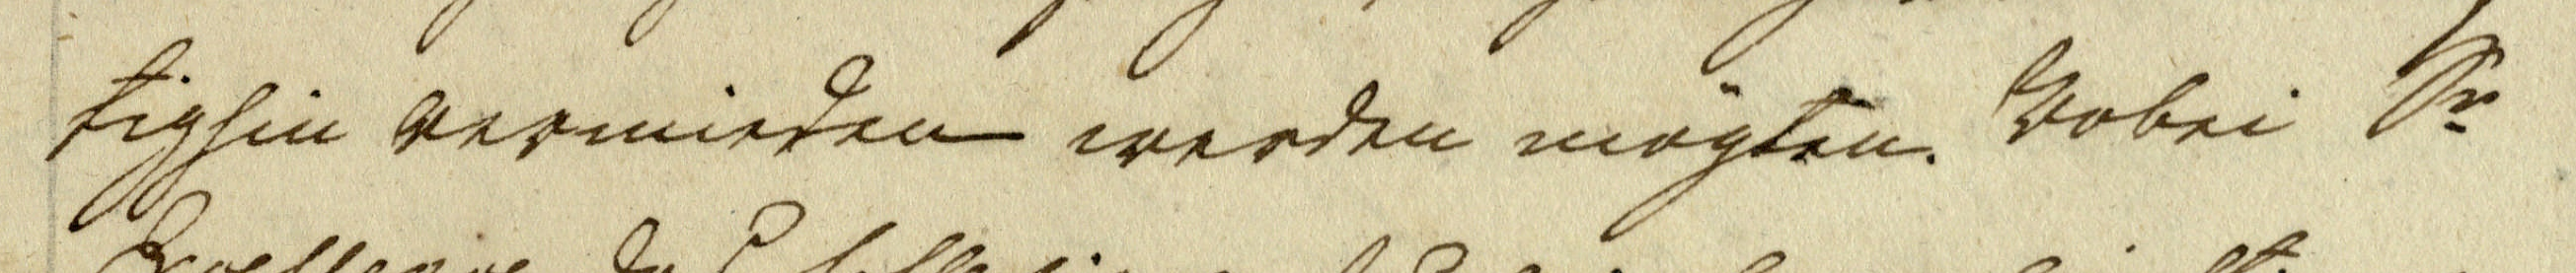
tighin vermieden werden mögten. Wobei Sr
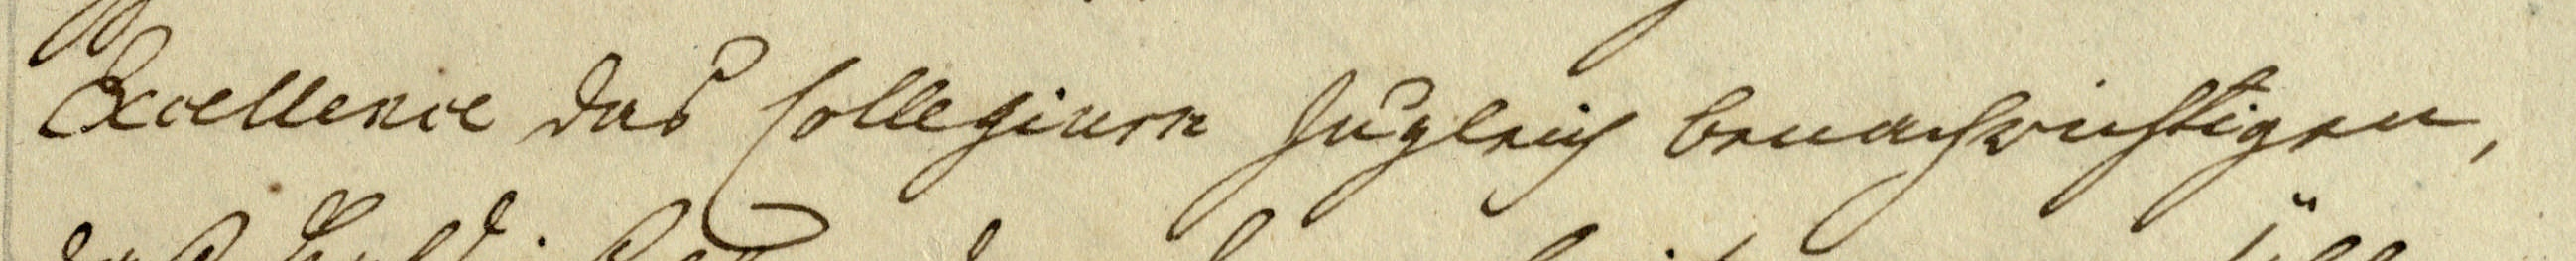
Excellence das Collegium zugleich benachrichtigen,
